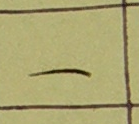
-
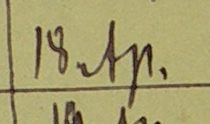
18. April
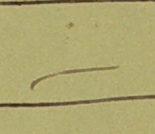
-
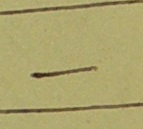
-
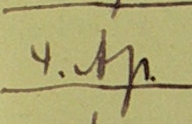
4. April
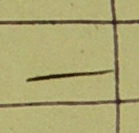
-
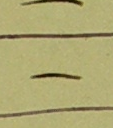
-
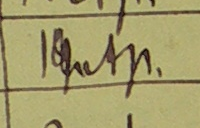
19. April
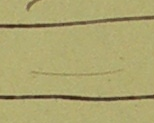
-
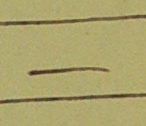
-
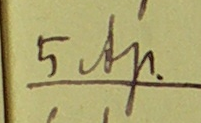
5. April
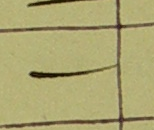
-
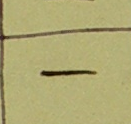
-
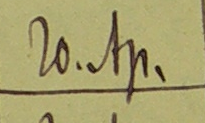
20. April
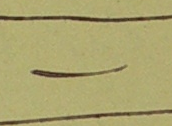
-
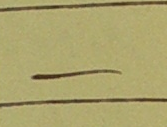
-
